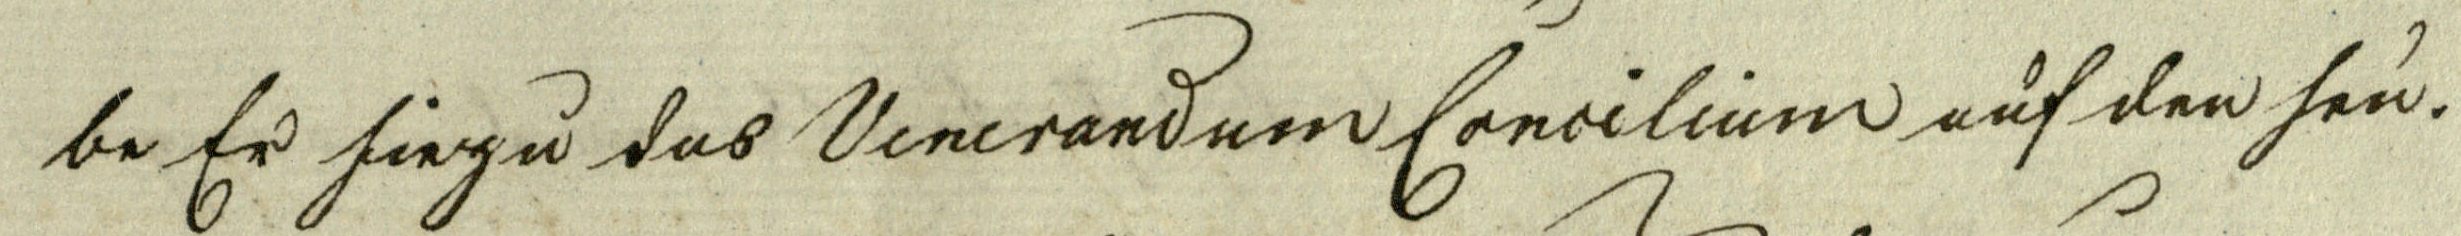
be Er hiezu das Venerandum Concilium auf den heu¬
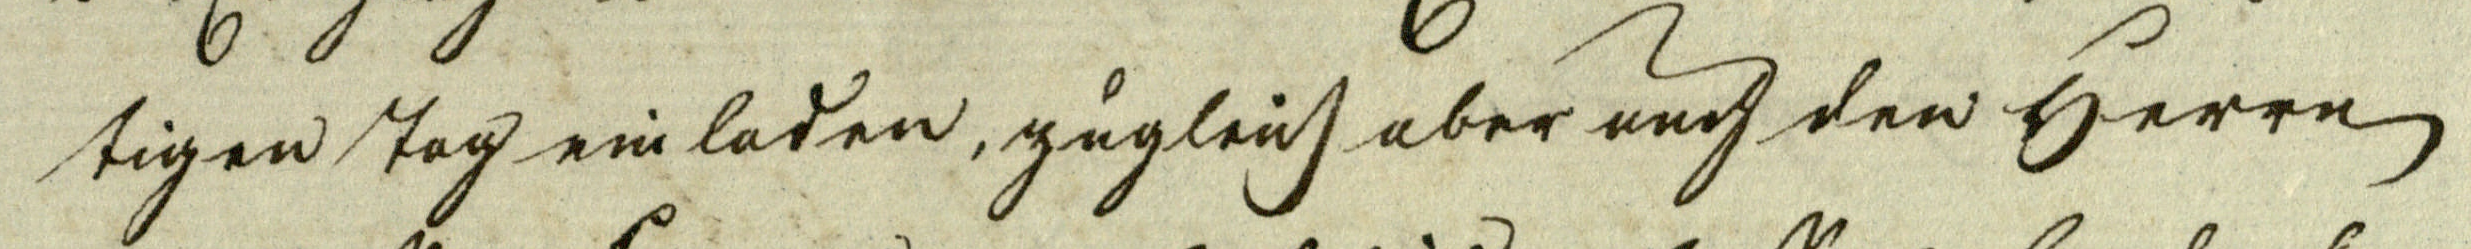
tigen Tag einladen, zugleich aber auch den Herrn
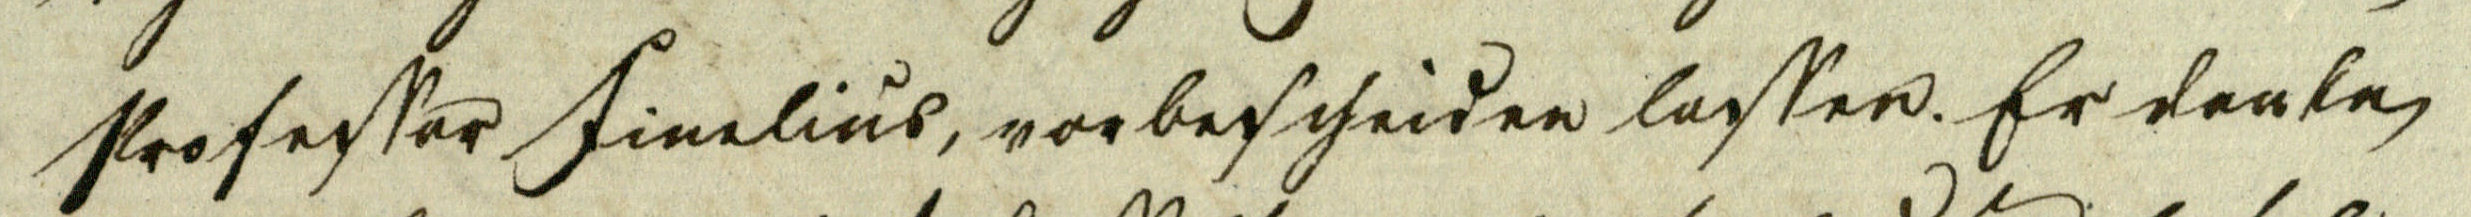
Professor Finelius, vorbescheiden lassen. Er danke
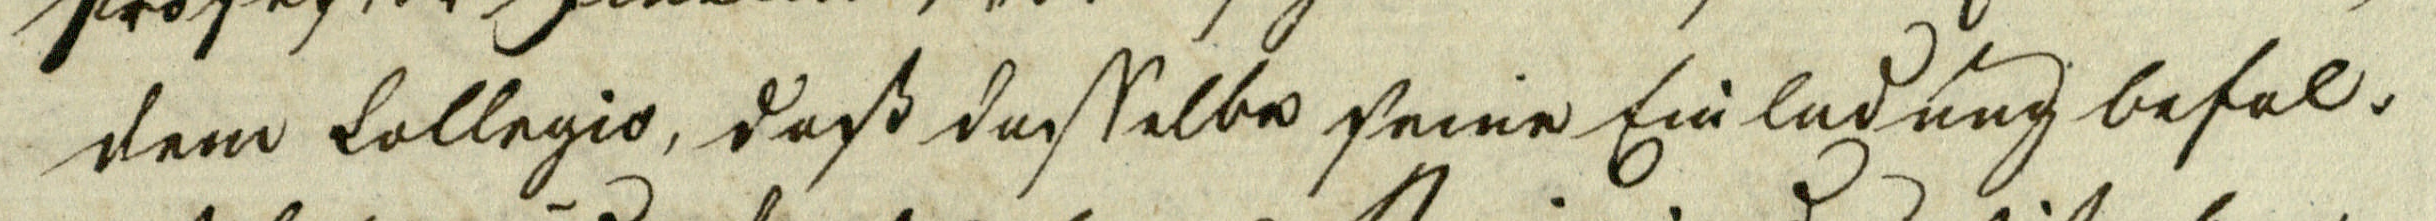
dem Collegio, daß dasselbe seine Einladung befol¬
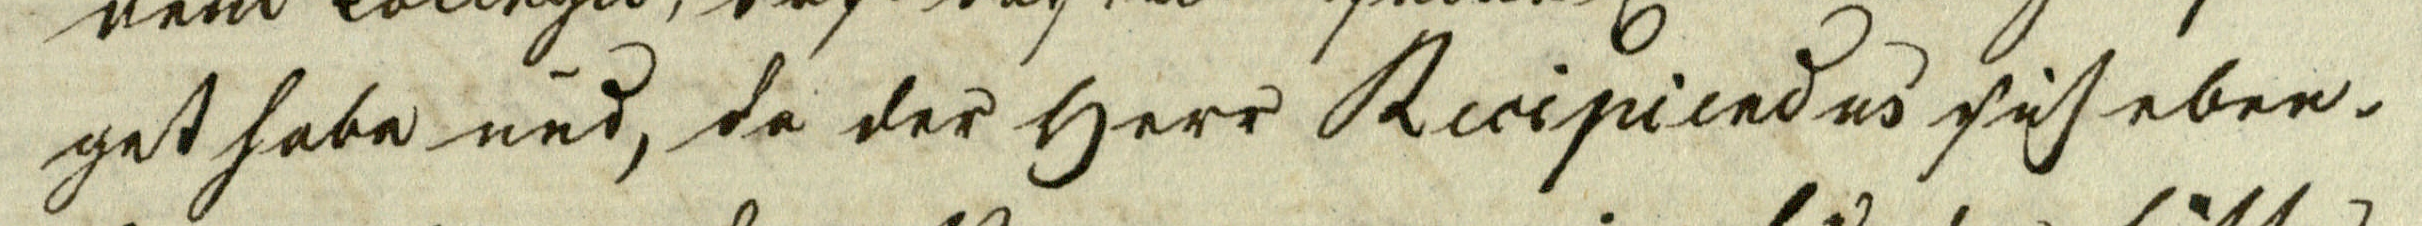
get habe und, da der Herr Recipiendus sich eben¬
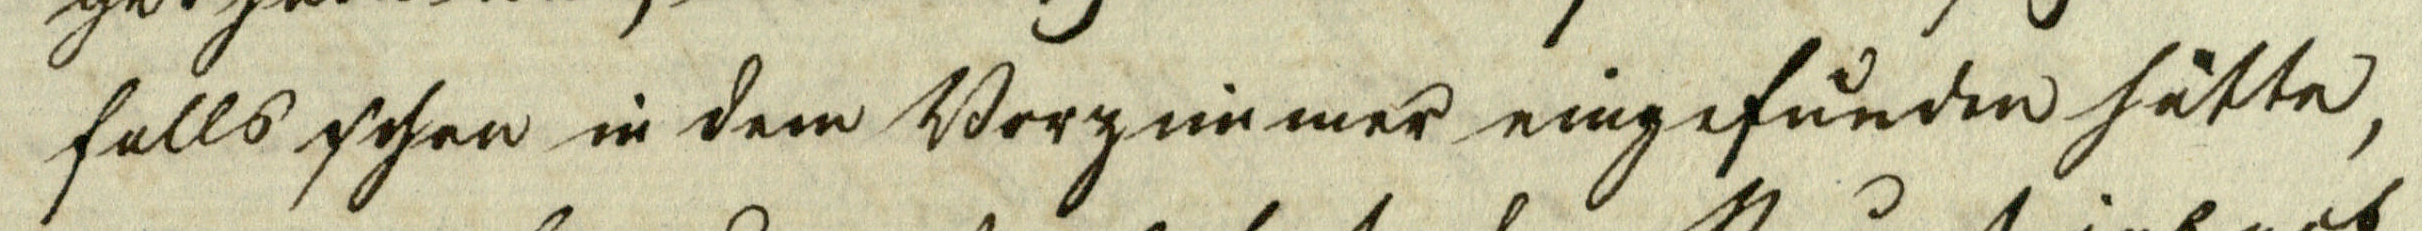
falls schon in dem Vorzimmer eingefunden hätte,
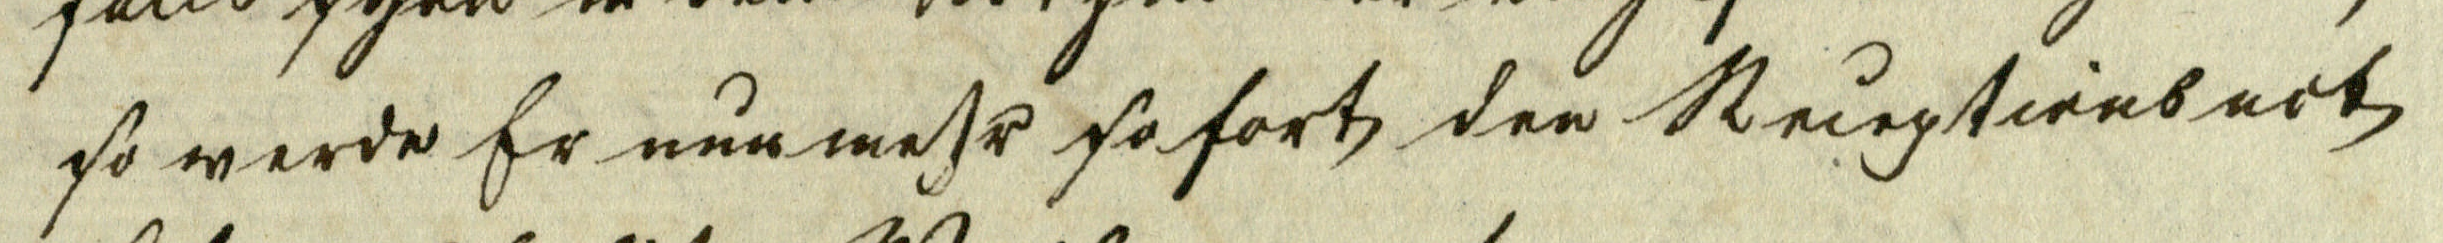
so werde Er nunmehr sofort den Receptionsact
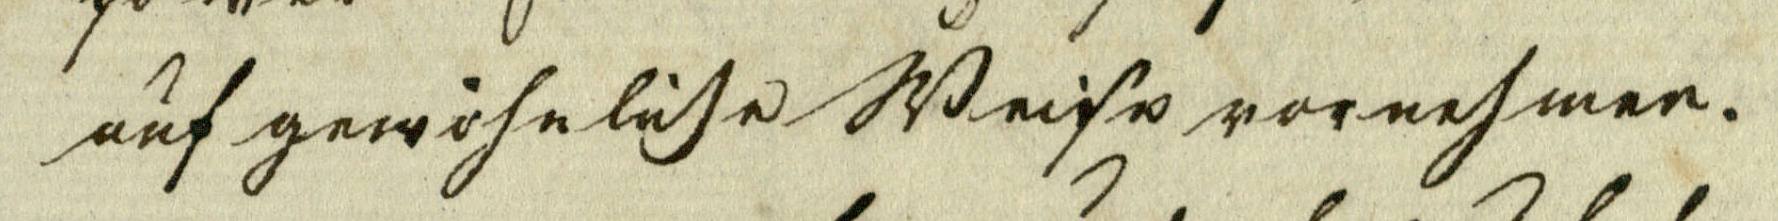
auf gewöhnliche Weise vornehmen.
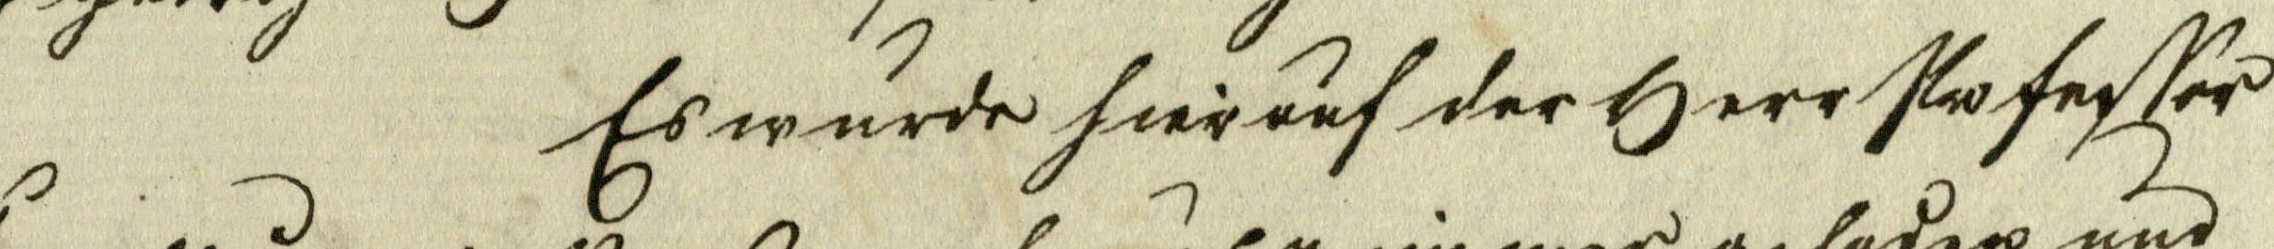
Es wurde hierauf der Herr Professor
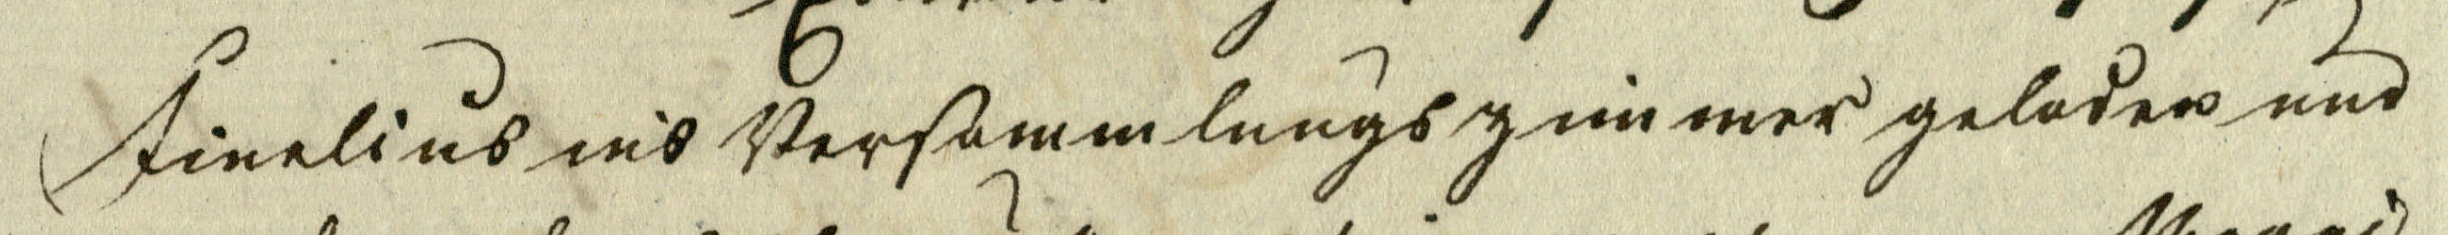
Finelius ins Versammlungszimmer geladen und
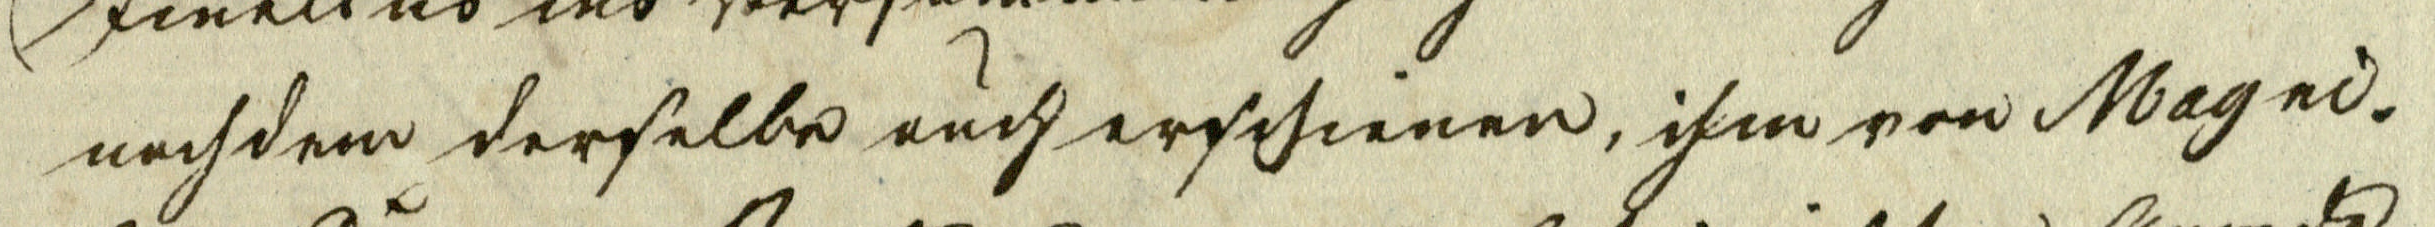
nachdem derselbe auch erschienen, ihm von Magni¬
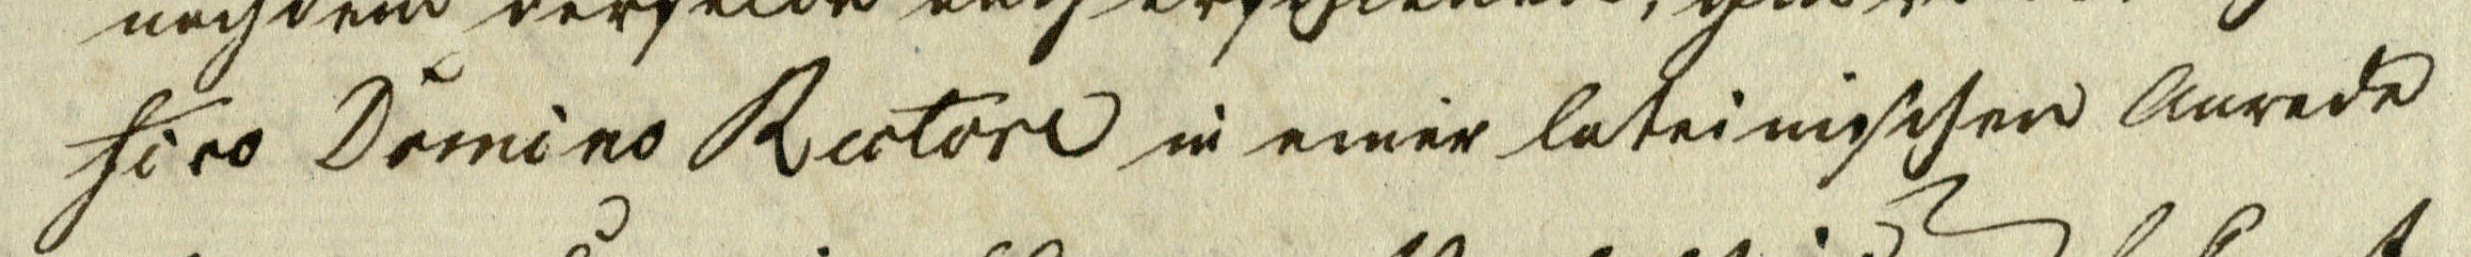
fico Domino Rectore in einer lateinischen Anrede
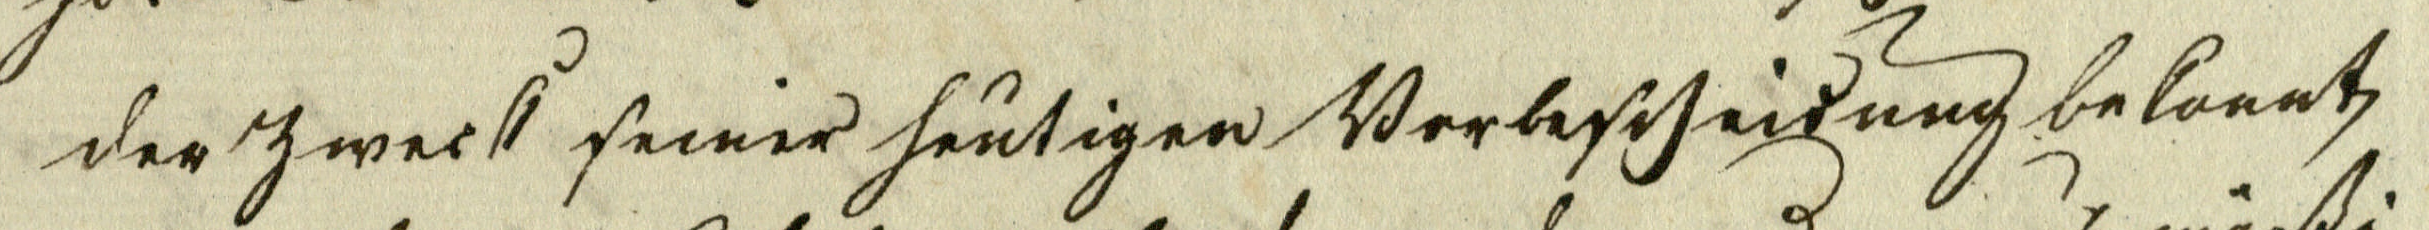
der Zweck seiner heutigen Vorbescheidung bekannt
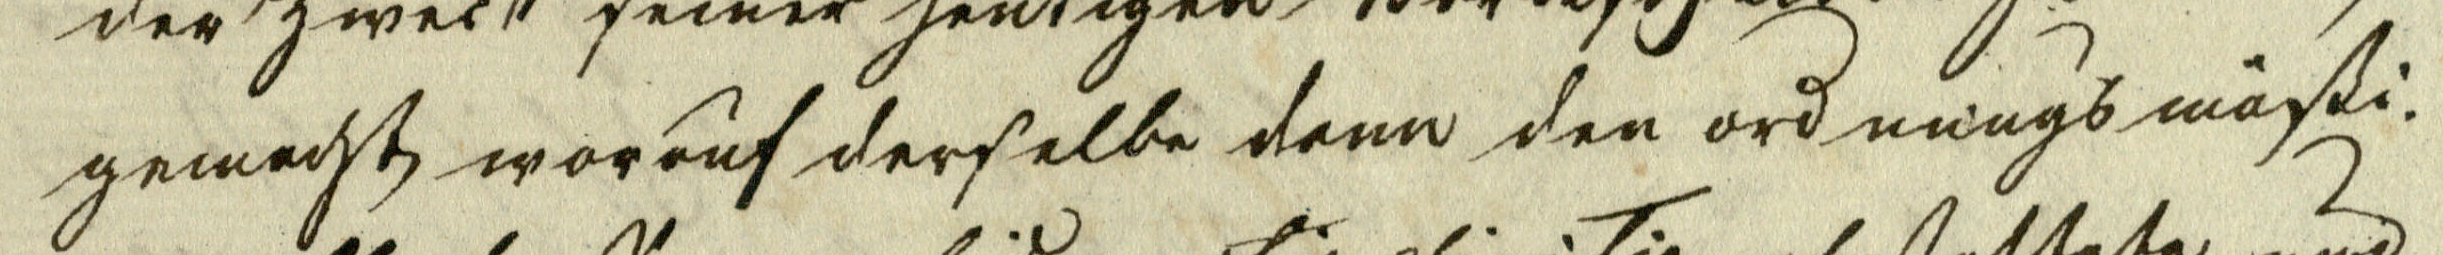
gemacht worauf derselbe dann den ordnungsmäßi¬
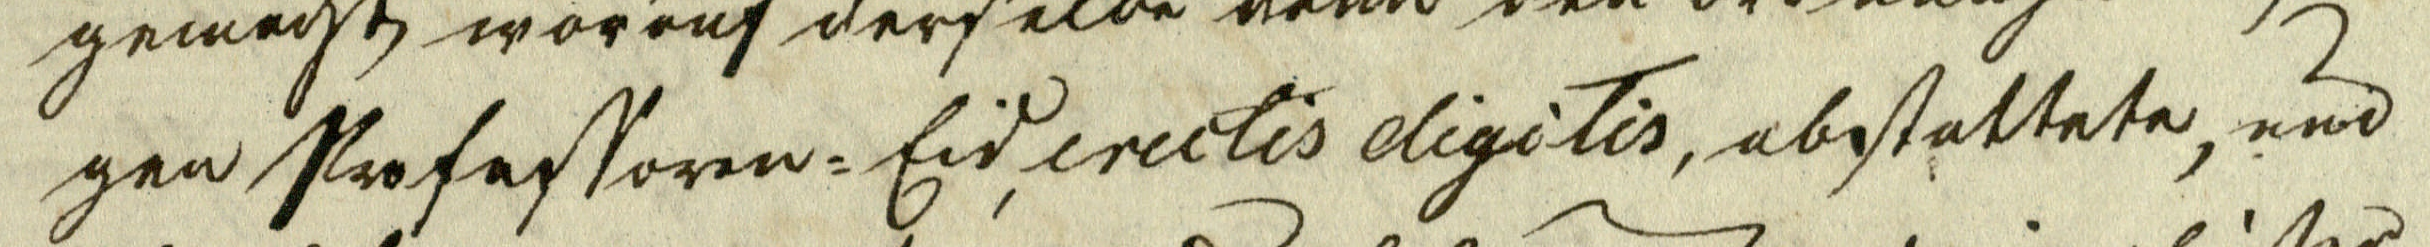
gen Proefessoren-Eid, erectis digitis, abstattete, und
